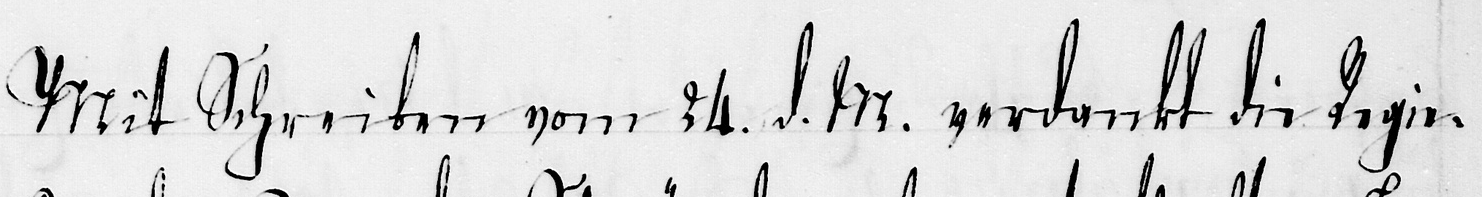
Mit Schreiben vom 26. d. M. verdankt die Regie¬
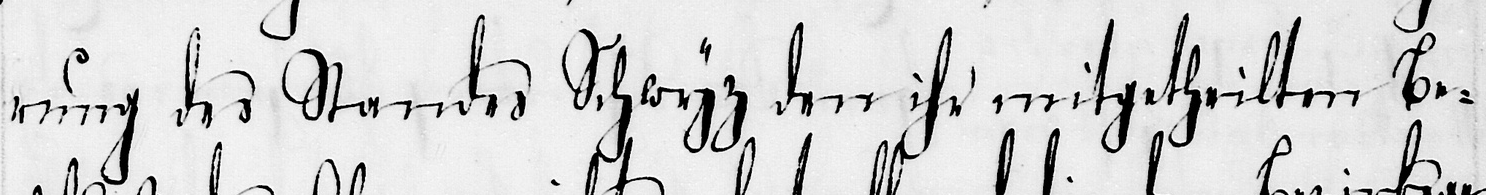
rung des Standes Schwyz den ihr mitgetheilten Be¬
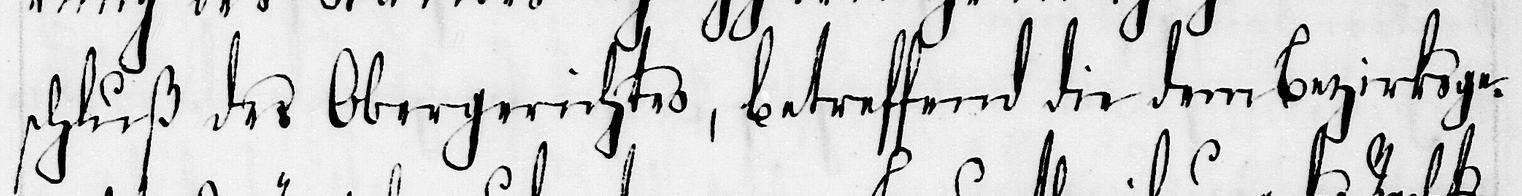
schluß des Obergerichtes, betreffend die dem Bezirksge¬
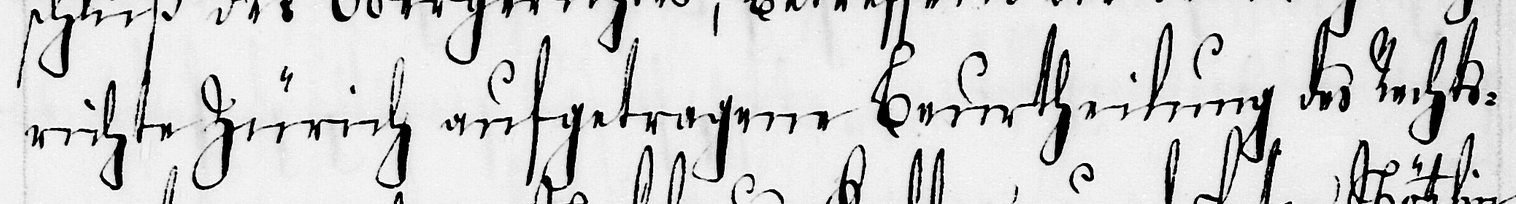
richte Zürich aufgetragene Beurtheilung des Rechts¬
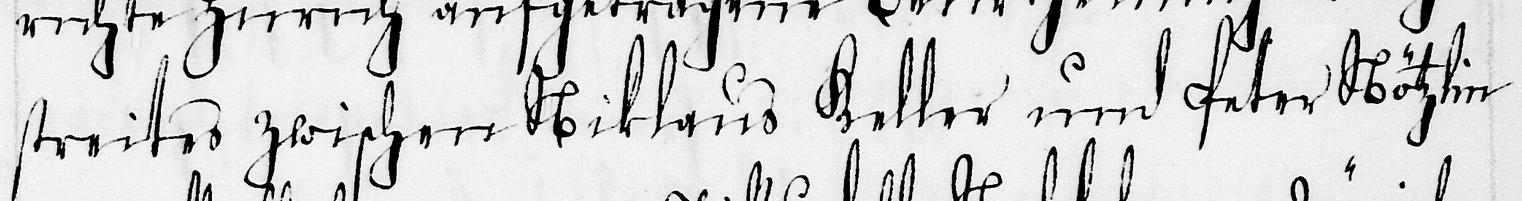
streites zwischen Niklaus Keller und Peter Nötzlin
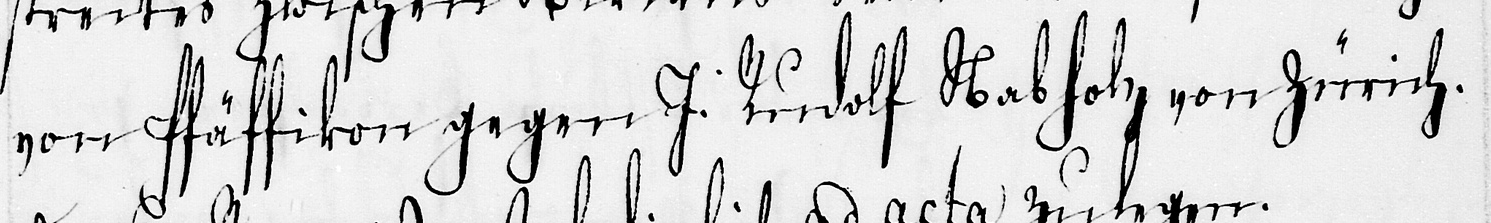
von Pfäffikon gegen J. Rudolf Nabholz von Zürich.
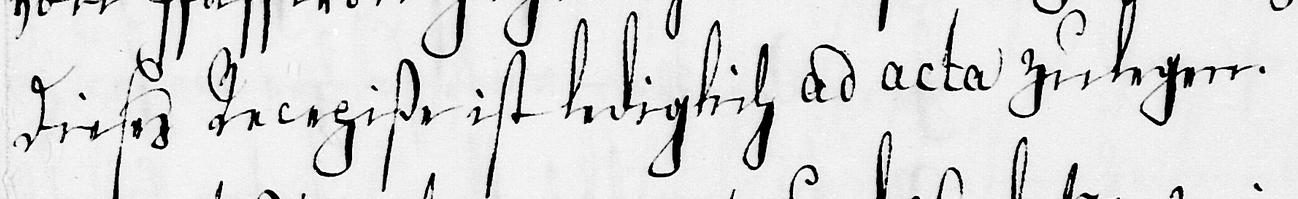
Dieses Recepiße ist lediglich ad acta zu legen.
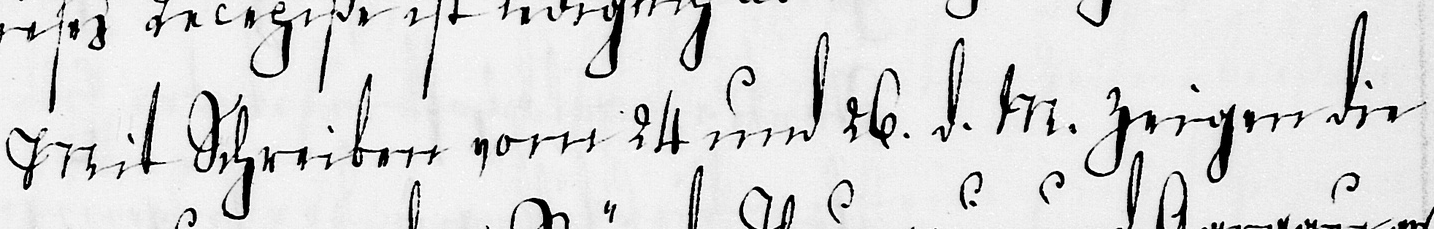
Mit Schreiben vom 24 und 26. d. M. zeigen die
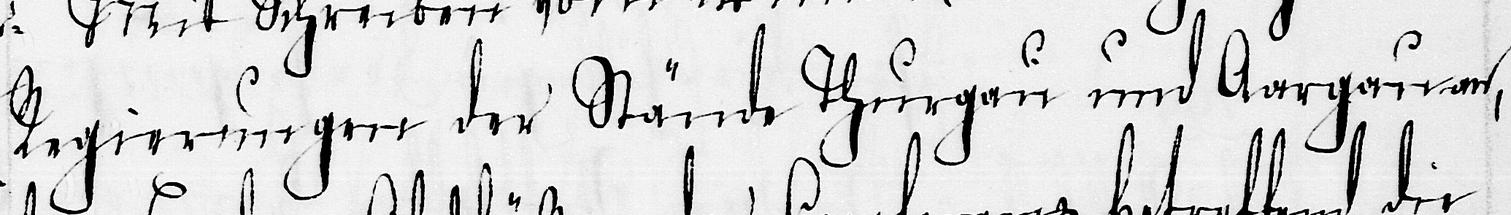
Regierungen der Stände Thurgau und Aargau an,
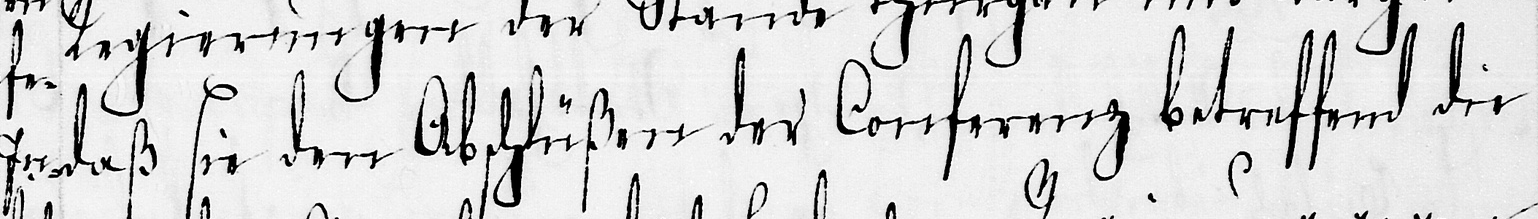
daß sie den Abschlüßen der Conferenz betreffend die
